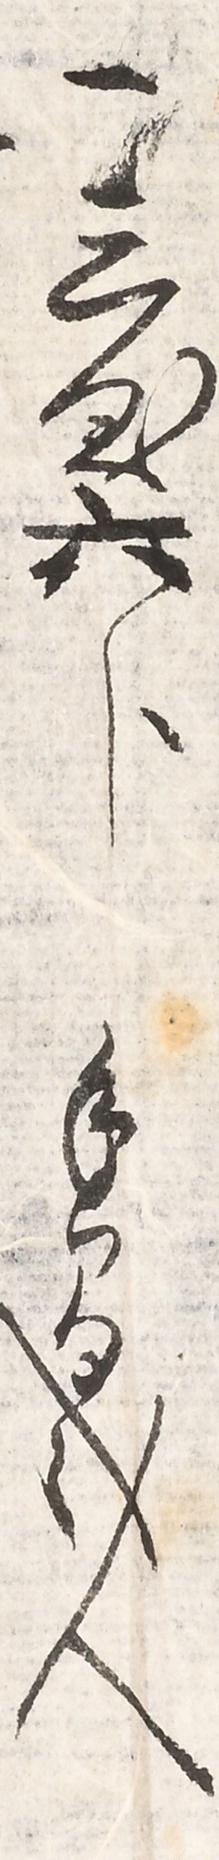一三匁六分手間弐人
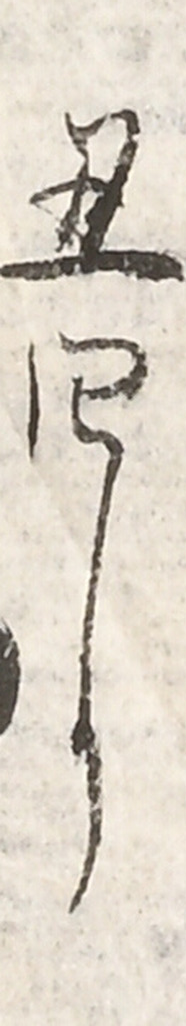丑四月
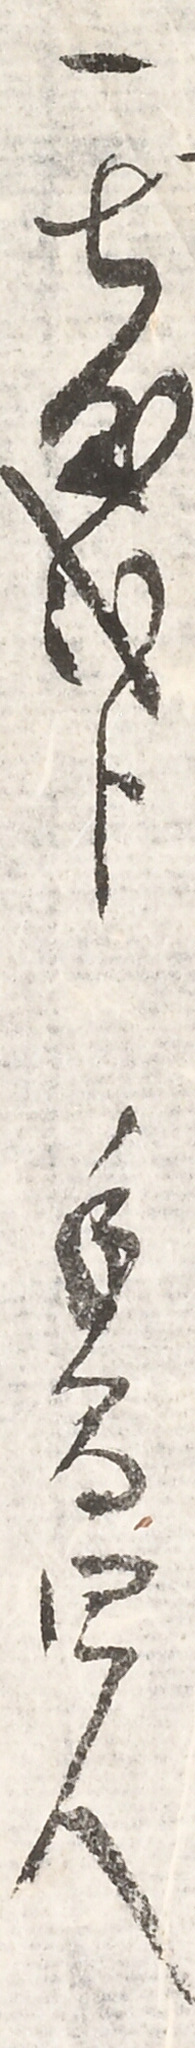一七匁弐分手間四人
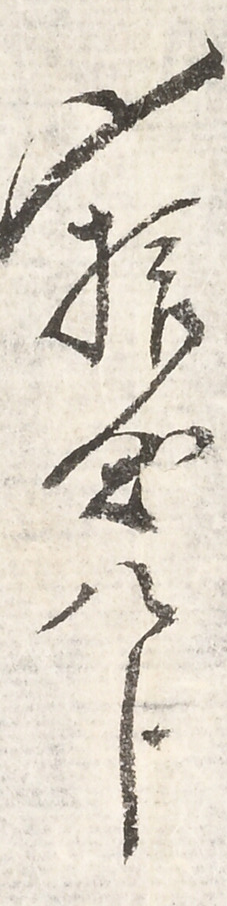〆拾匁八分
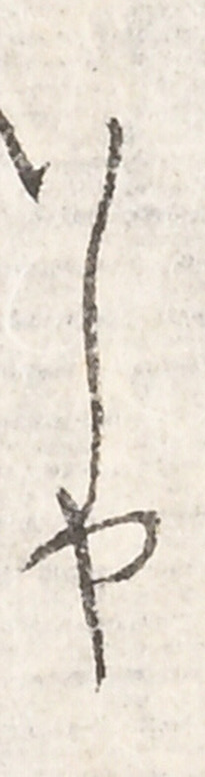いしや
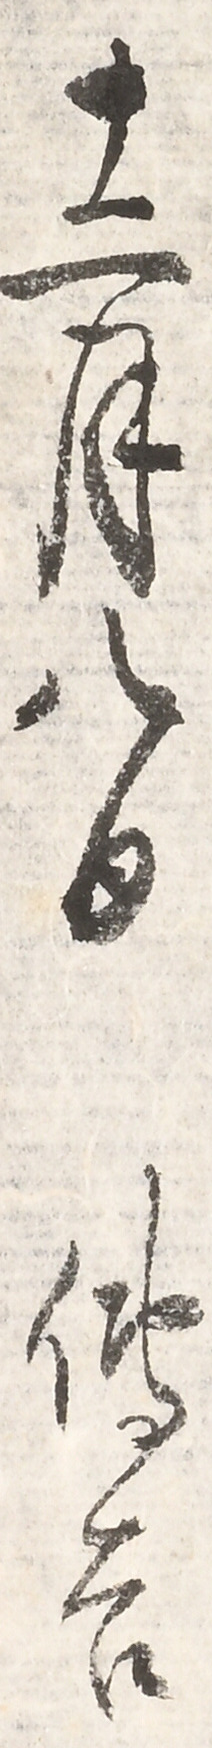十二月八日伝吉
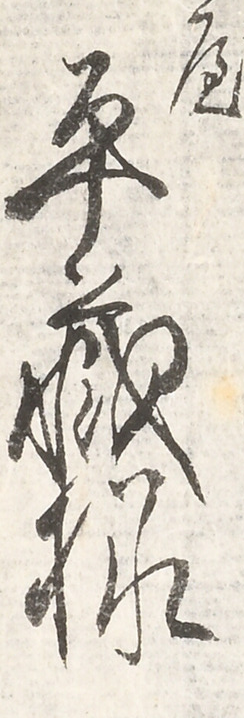平蔵様
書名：覚
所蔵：伊那市立高遠町図書館・合同会社AMANE
